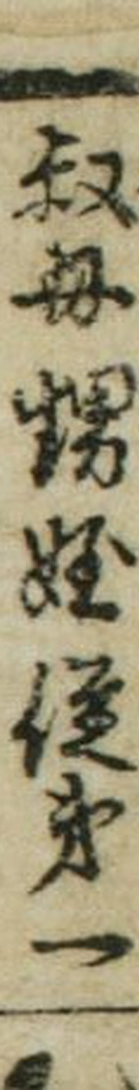叔母甥姪従弟一
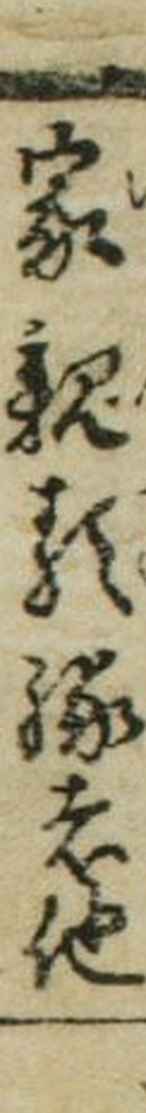家親類縁者他
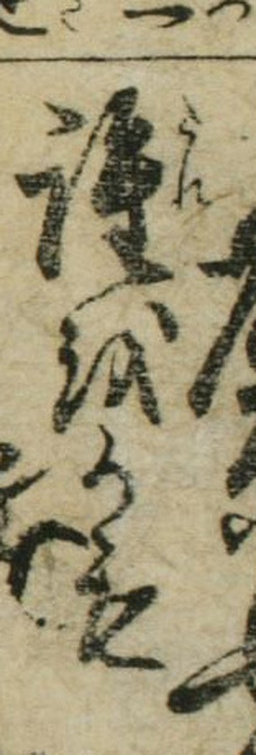誰をかも
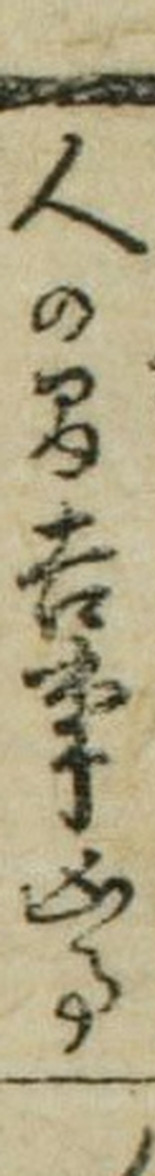人の間吉事凶事
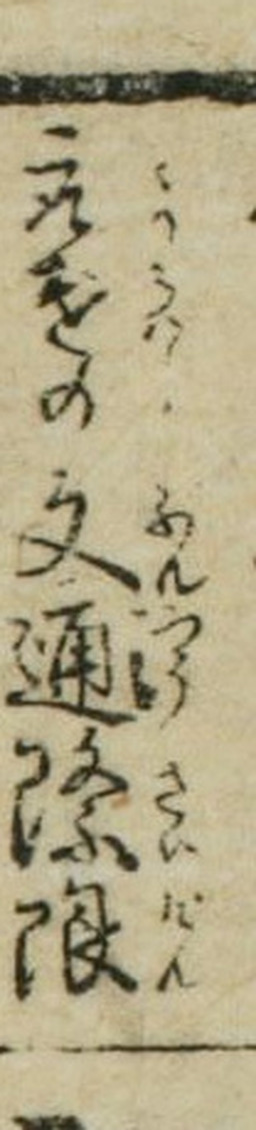取遣の文通際限
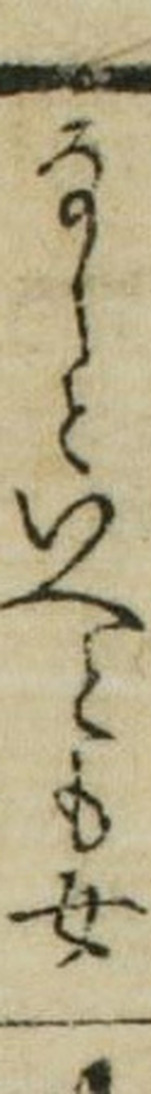なしといへとも女
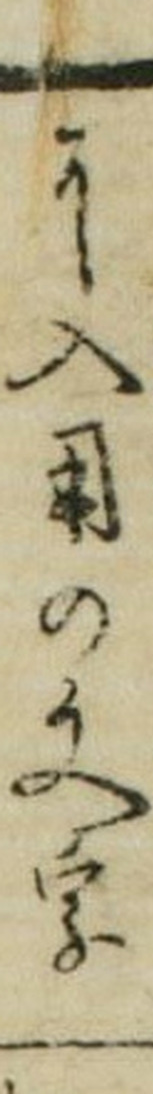に入用の文字
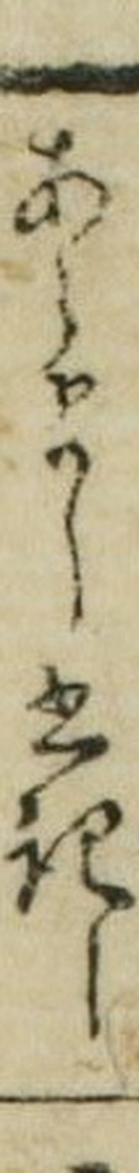あらまし書記し
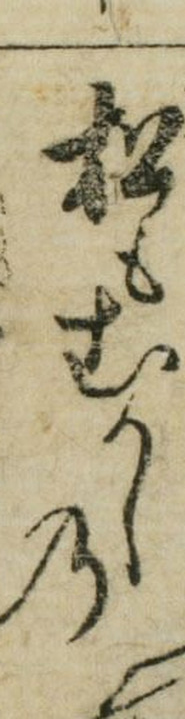松もむかしの
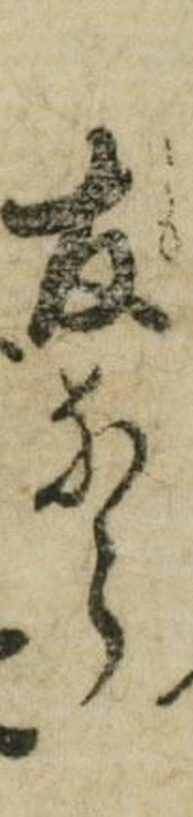友なら
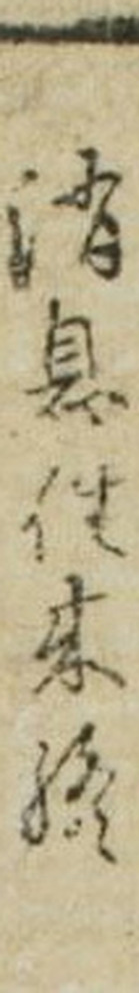消息往来終
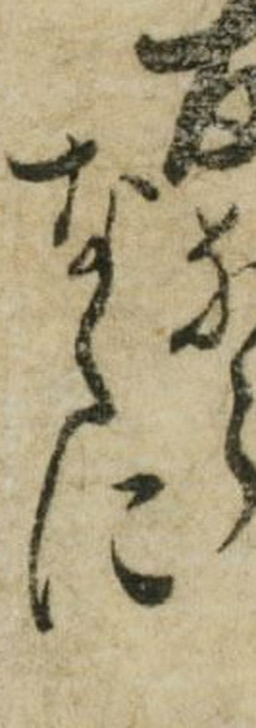なくに
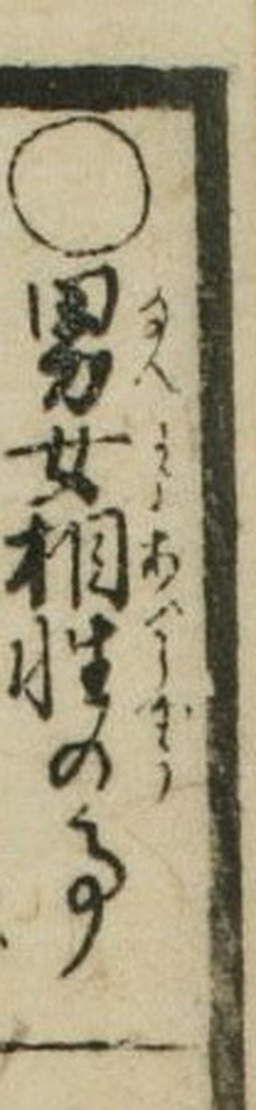○男女相性の事
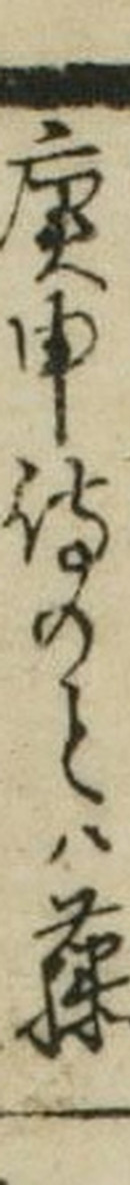庚申待のことは藤
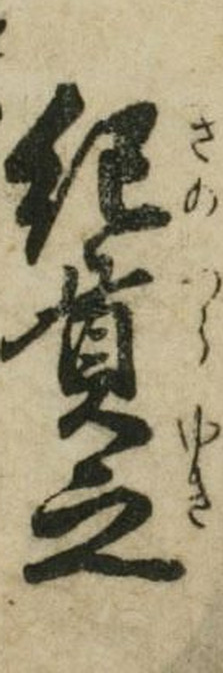紀貫之
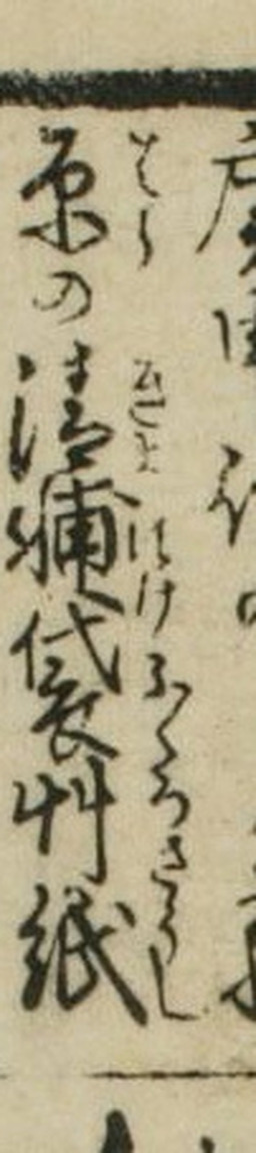原の清輔袋草紙
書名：百人一首
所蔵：東京学芸大学教育コンテンツアーカイブ
